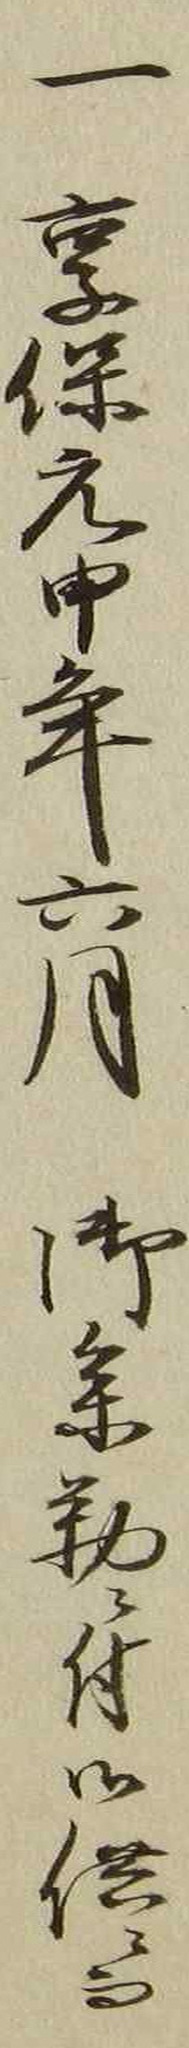一享保元申年六月御参勤ニ付御供ニ而
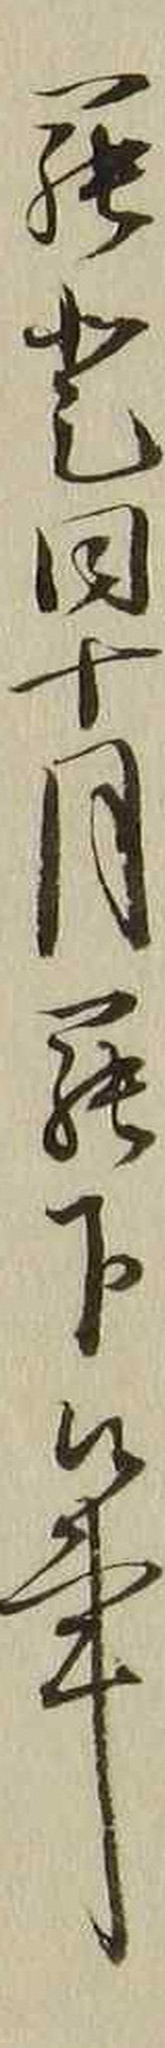罷登同十月罷下候事
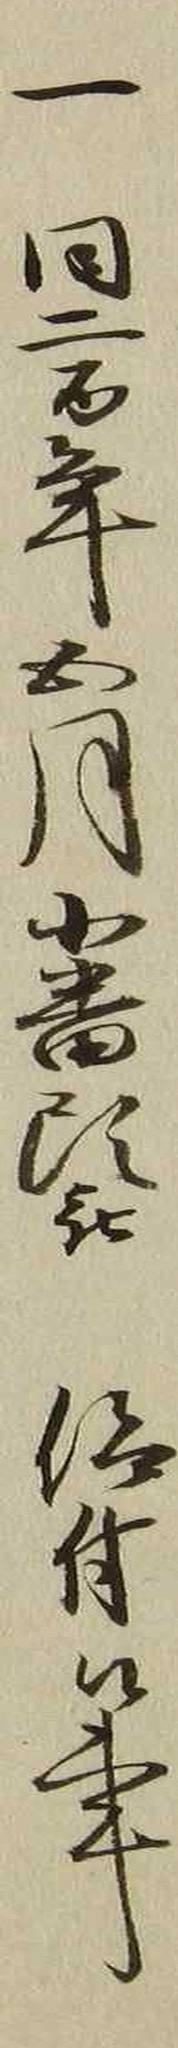一同ニ酉年五月小番頭被仰付候事
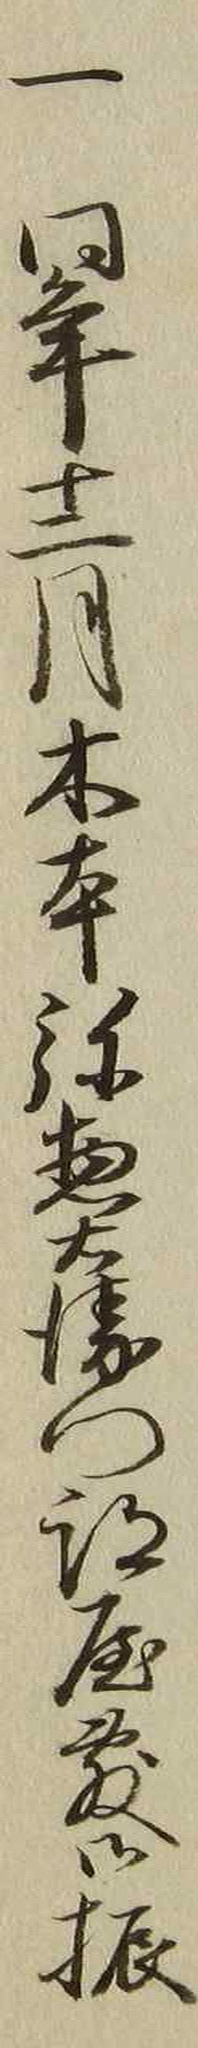一同年十二月木本弥惣右衛門跡屋敷御揮
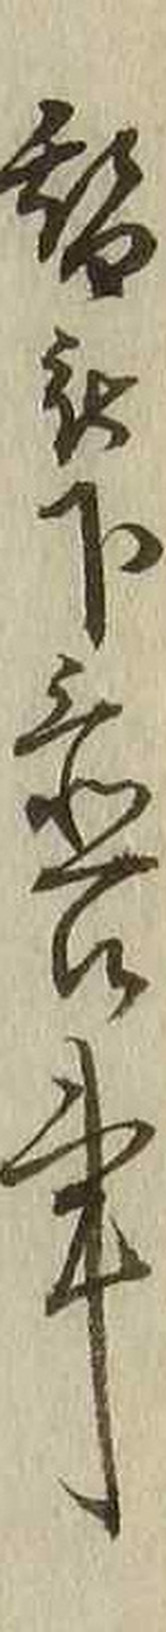替被下置候事
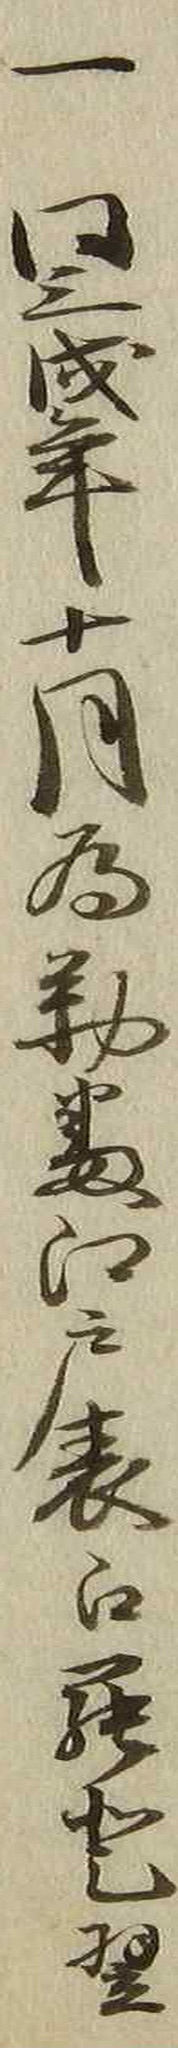一同三戌年十月為勤番江戸表江罷登翌
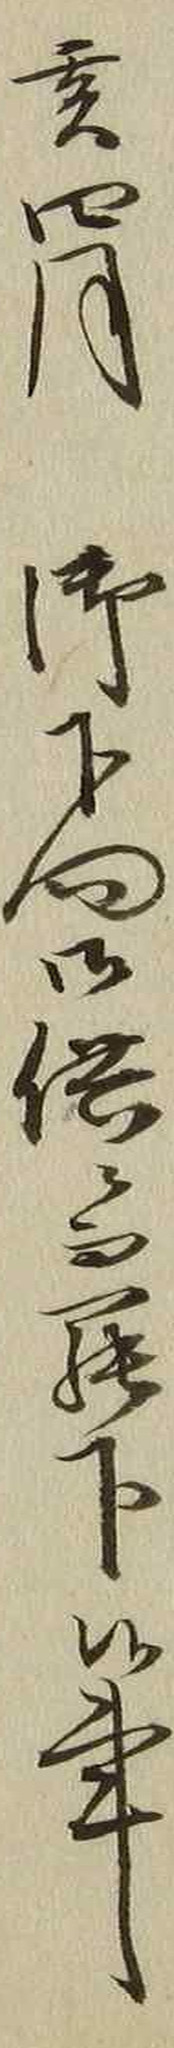亥四月御下向御供ニ而罷下候事
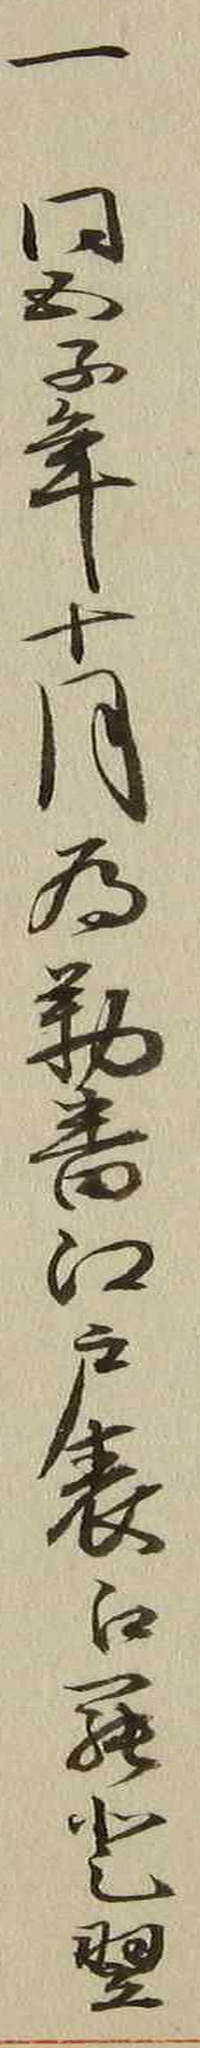一同五子年十月為勤番江戸表江罷登翌
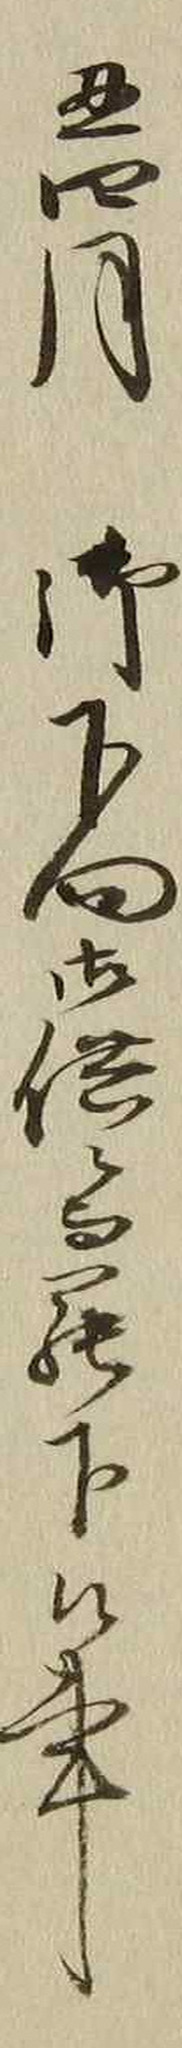丑四月御下向御供ニ而罷下候事
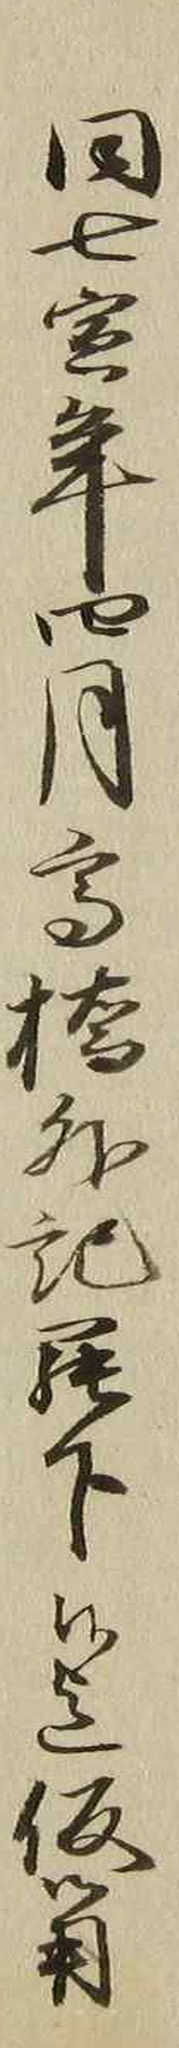一同七寅年四月高橋外記罷下候迄仮御用
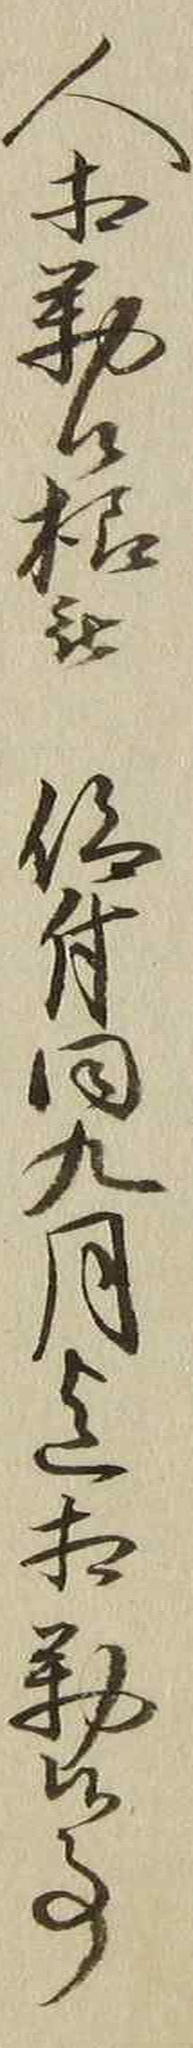人相勤候様被仰付同九月迄相勤候事
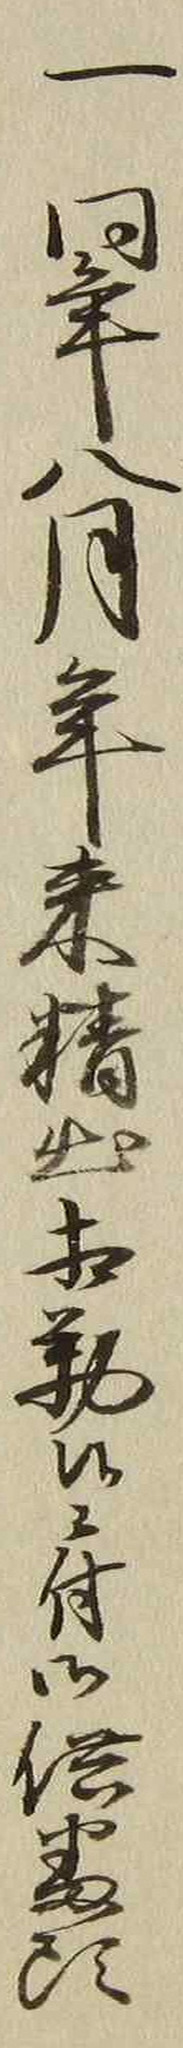一同年八月年来精出相勤候ニ付御供番頭
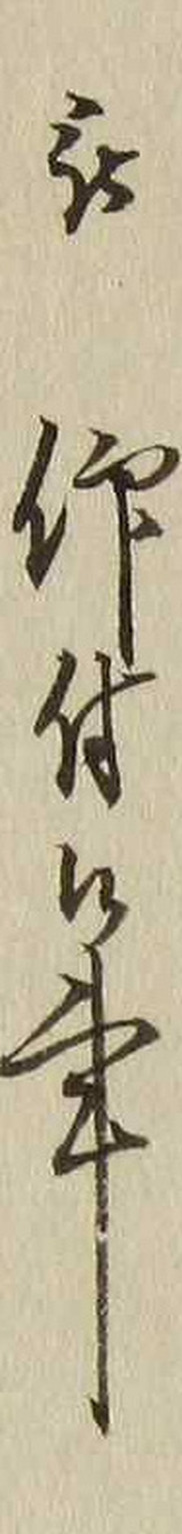被仰付候事
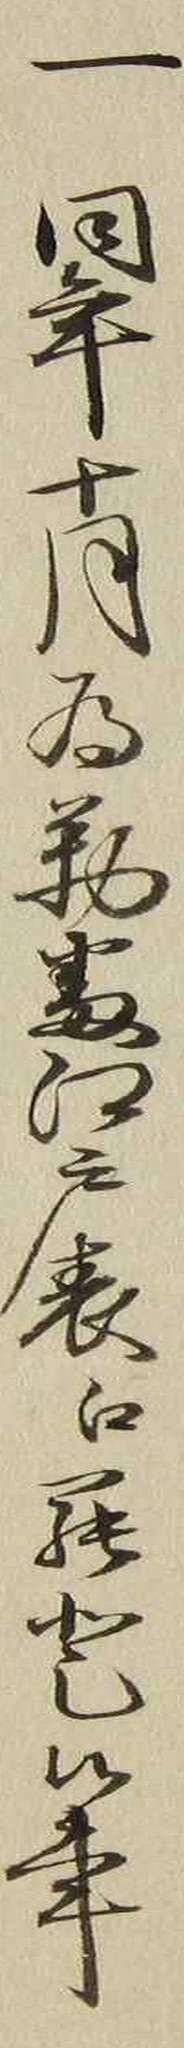一同年十月為勤番江戸表江罷登候事
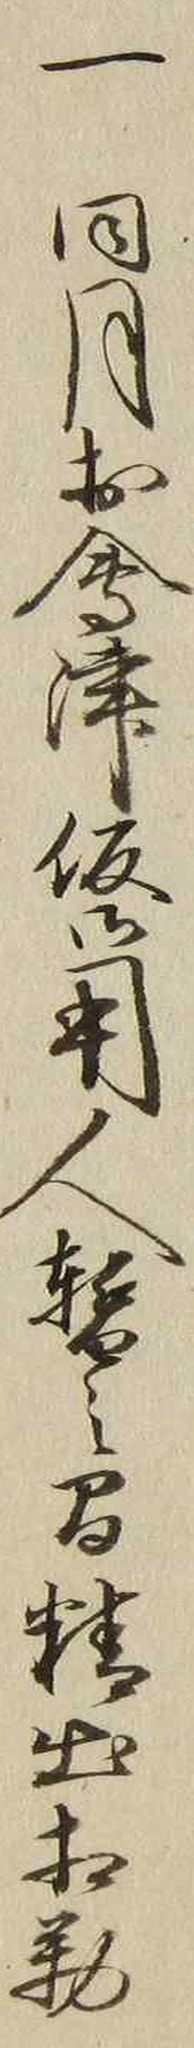一同月お会津仮御用人暫之間精出相勤
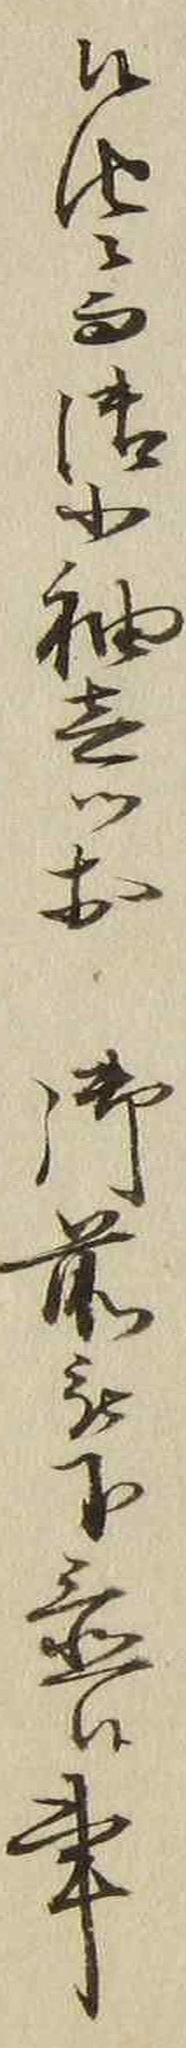候由ニ而御小袖壱ツお御前被下置候事
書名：諸士系譜　巻之114　か之部22
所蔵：会津若松市立会津図書館
